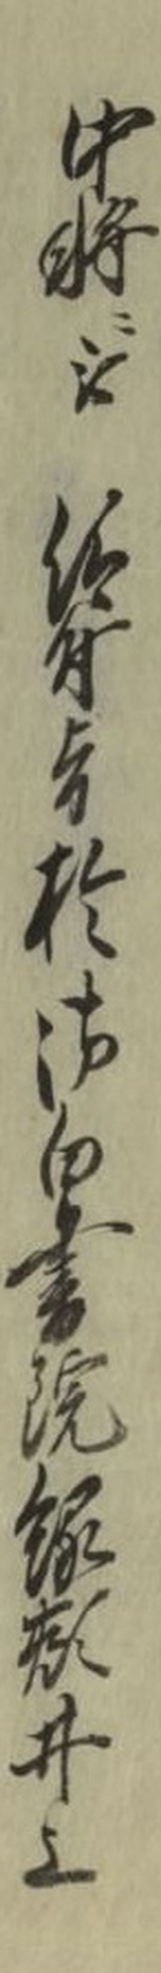中将二被仰付旨於御白書院縁頬井上
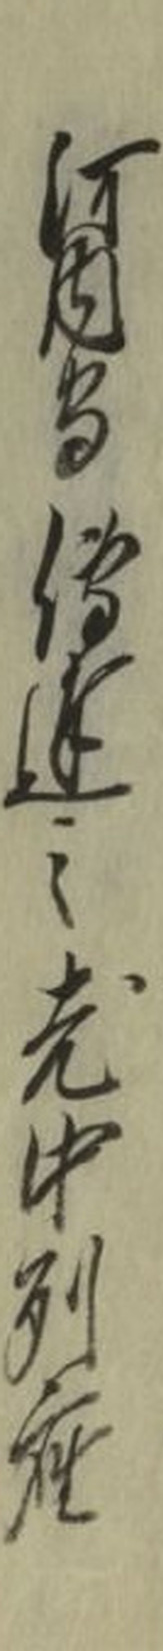河内守伝達之老中列座
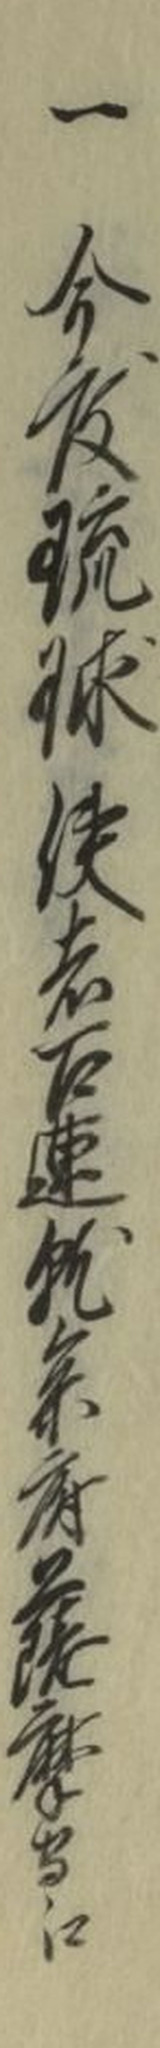一今度琉球使者召連就参府薩摩守え
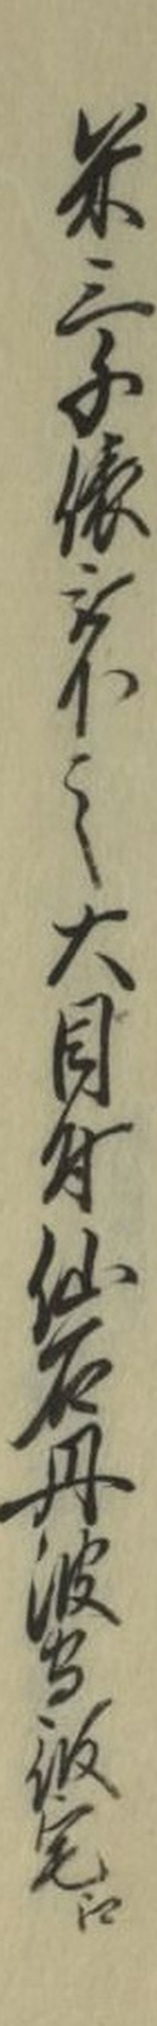米三千俵被下之大目付仙石丹波守仮宅え
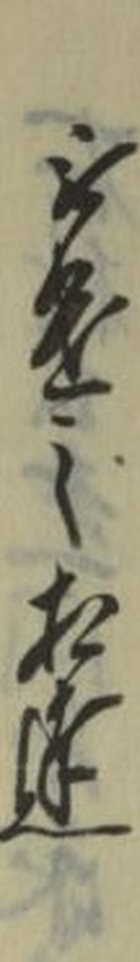被遣之相達
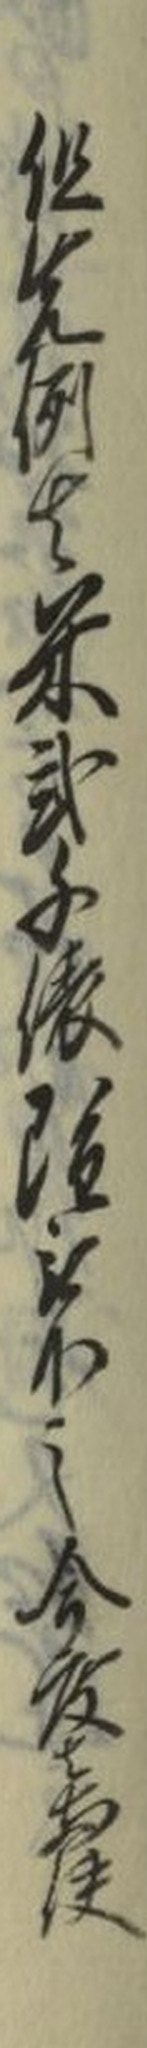但先例は米弐千俵程被下之今度は両使
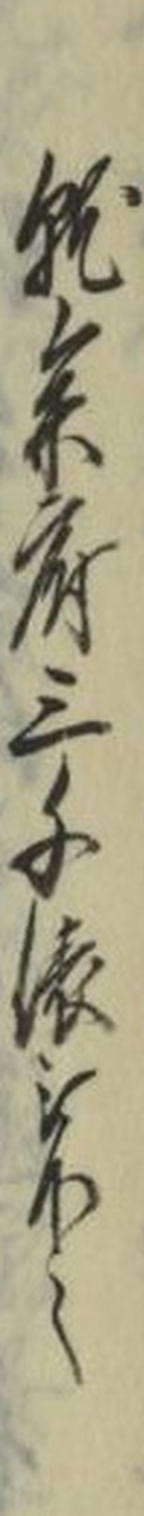就参府三千俵被下之
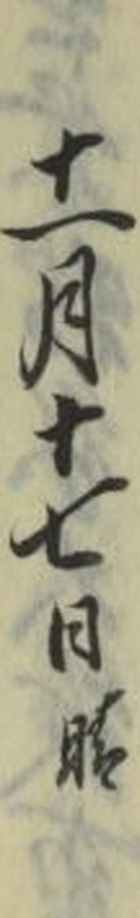十一月十七日晴
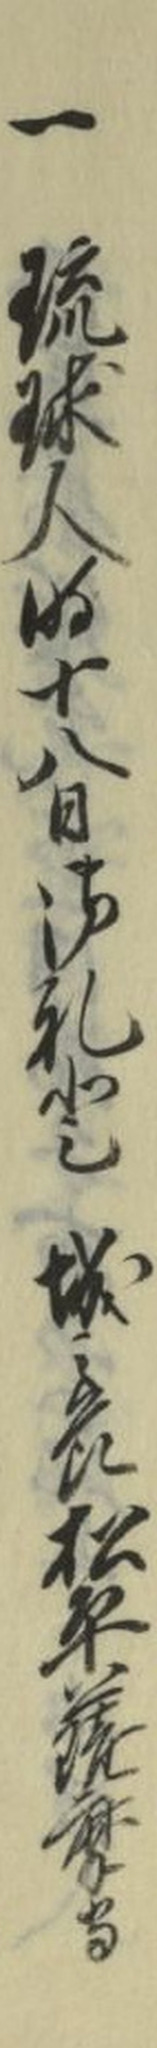一琉球人明十八日御礼登城之節松平薩摩守
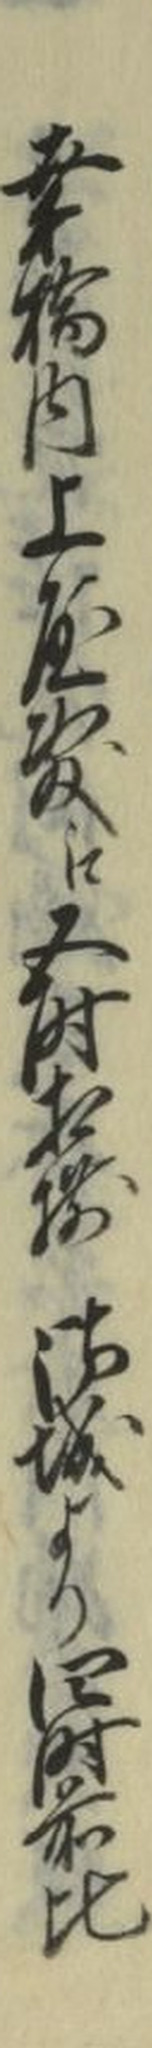幸橋内上屋敷え五時相揃御城より四時前比
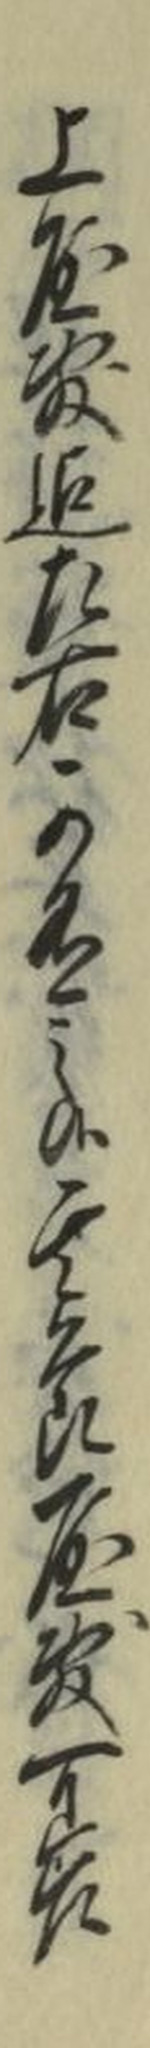上屋敷迄左右可有之候其節屋敷可差
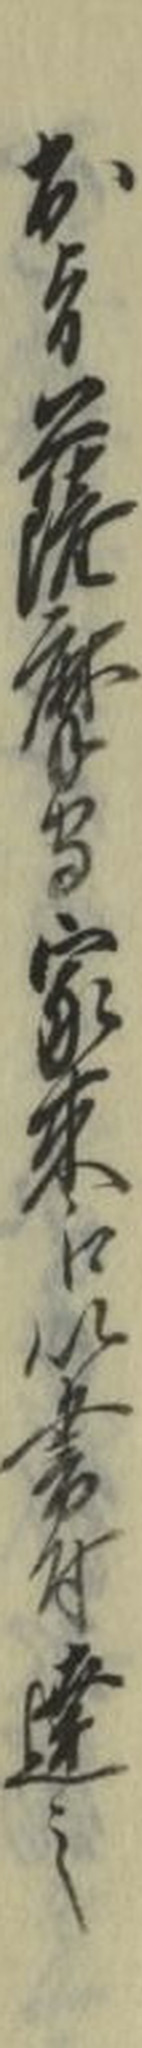出旨薩摩守家来え以書付達之
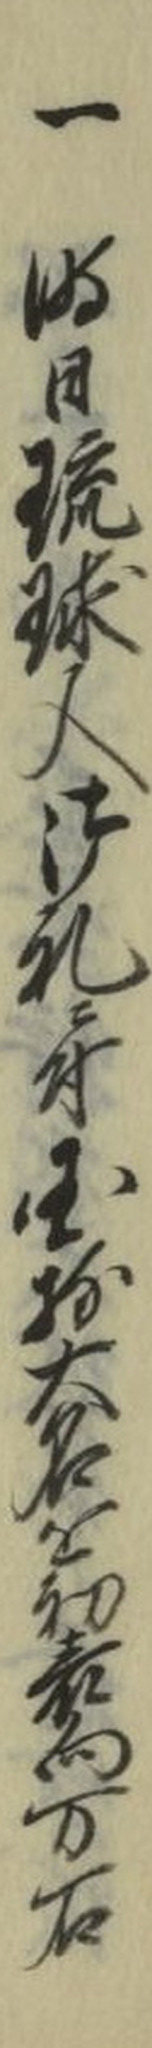一明日琉球人御礼ニ付国持大名を初表向万石

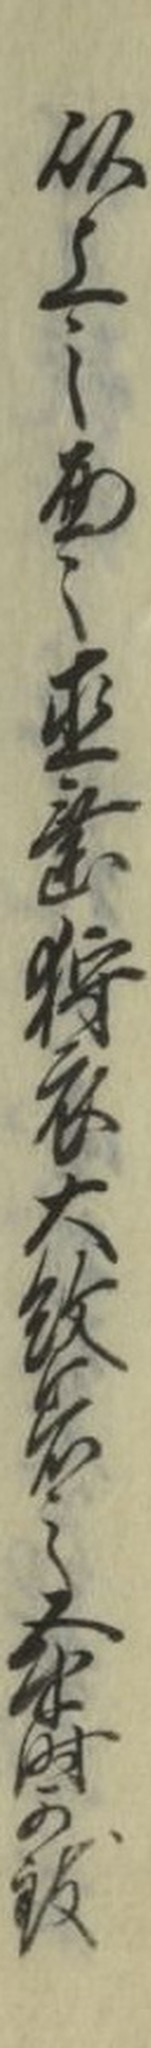以上之面々直垂狩衣大紋着之五半時可致
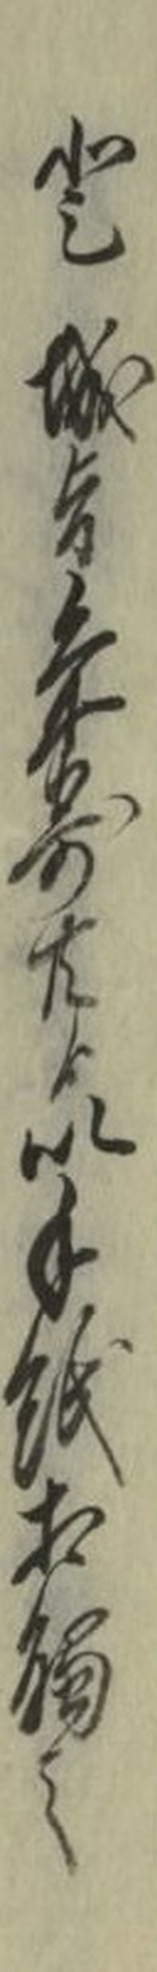登城旨年寄共ゟ以手紙相觸之
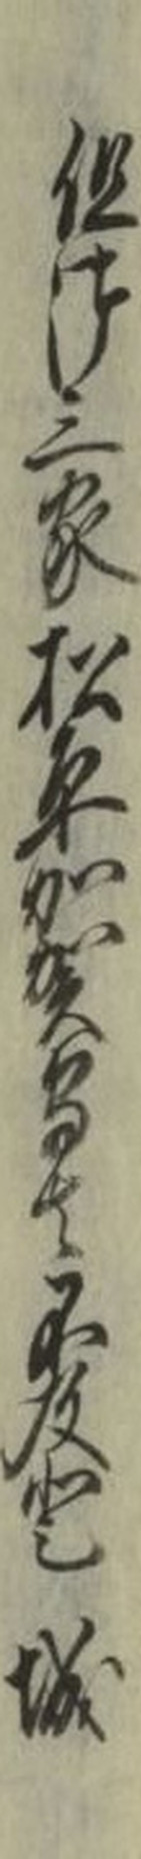但御三家松平加賀守は不及登城
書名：琉球人参府記
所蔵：University of the Ryukyus Library
